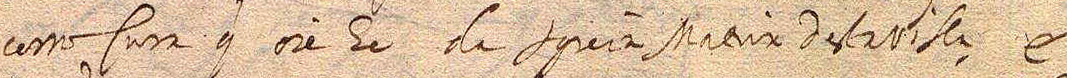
como Cura q̄ oie he da Jgreia Matrix desta villa, &
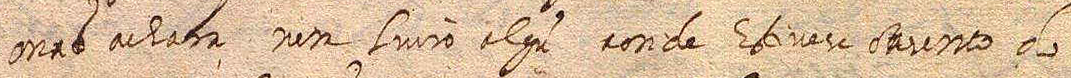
o naõ achara, nem liuro algū aonde Estiuesse o asento do
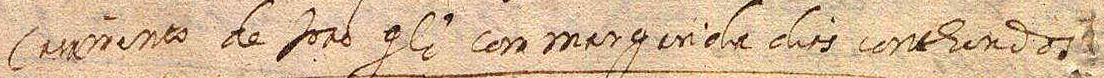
Casamento de Joaõ glz̄ con margarida dias contheudos
